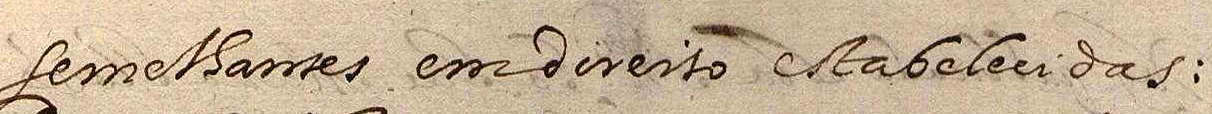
semelhantes em direito estabelecidas:
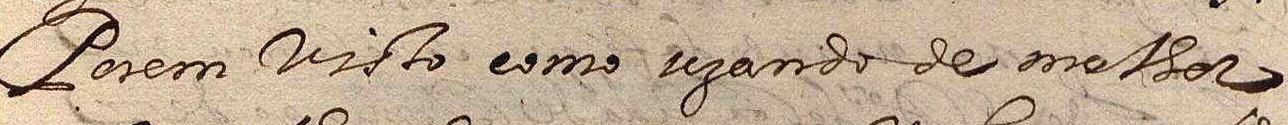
Porem visto como uzando de melhor
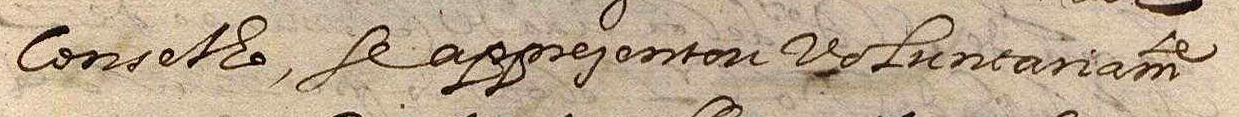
Conselho, se appresentou voluntariamte
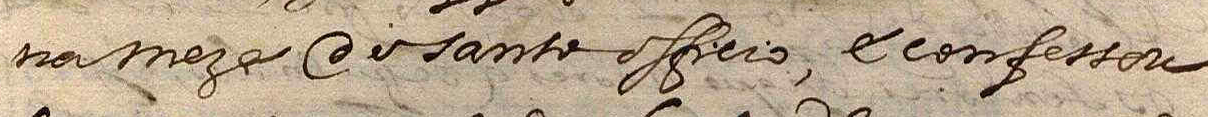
na meza do santo officio, & confessou
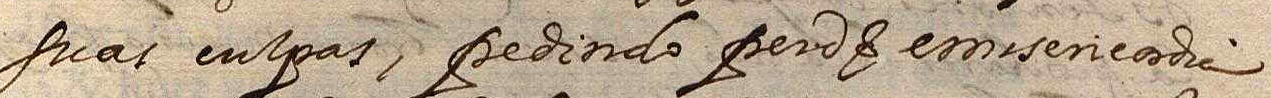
suas culpas, pedindo perdaõ e misericordia
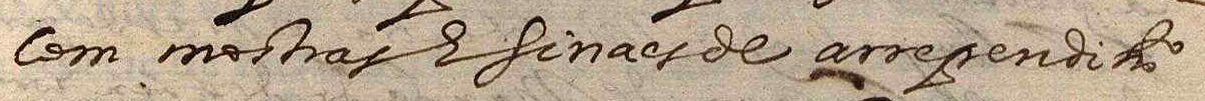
com mostras E sinaes de arrependimto
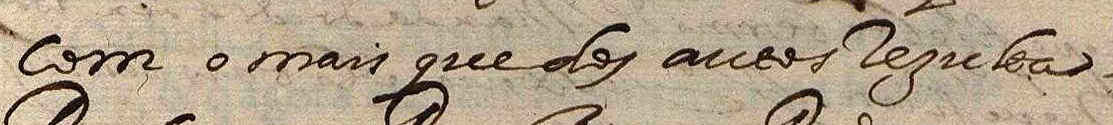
com o mais que dos autos Rezulta
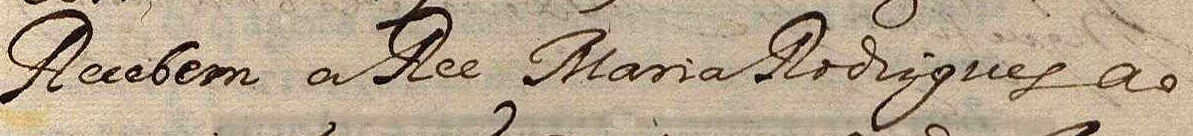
Recebem a Ree Maria Rodrigues ao
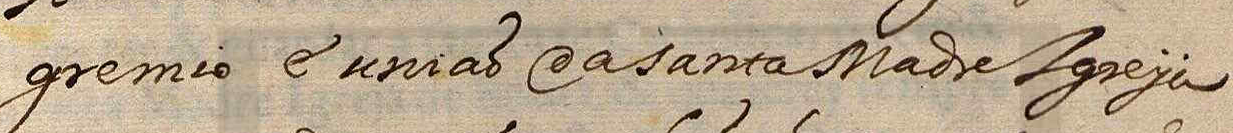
gremio & uniaõ da santa Madre Igreya
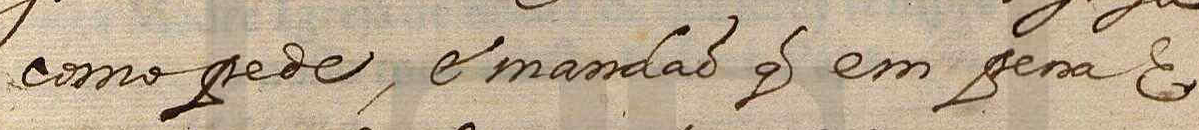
como pede, & mandaõ q̄ em pena E
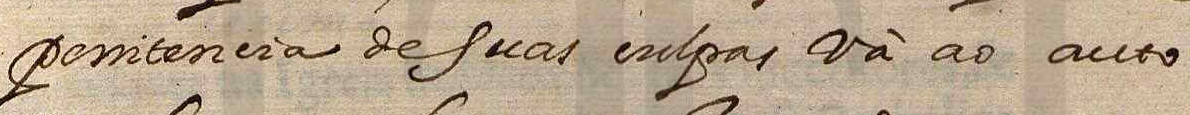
penitencia de suas culpas vá ao auto
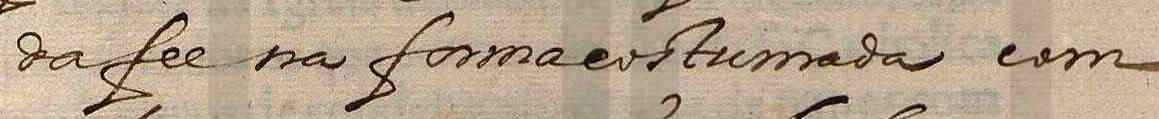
da fee na forma costumada com
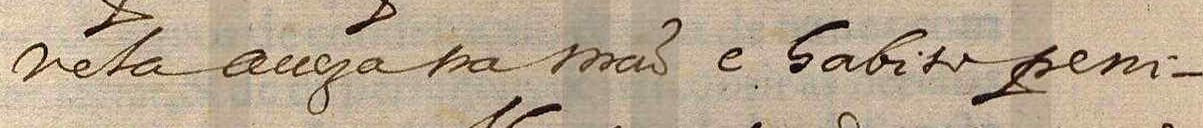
vela acceza na maõ e habito peni
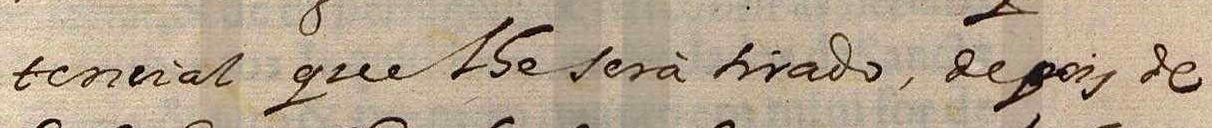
tencial que lhe será tirado, depois de
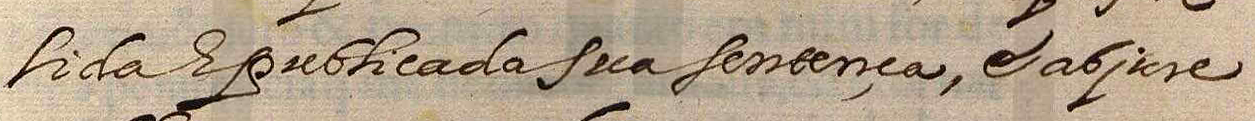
lida E publicada sua sentença, & abjure
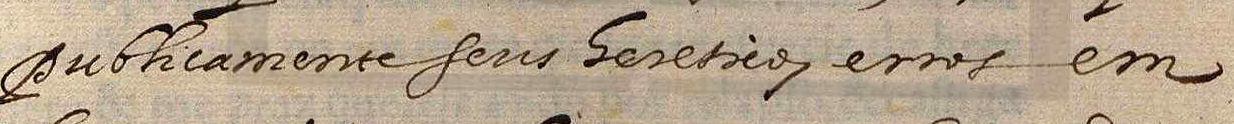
publicamente seus hereticos erros em
